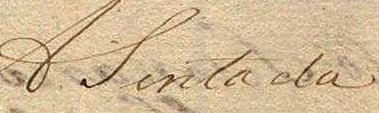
ASentada
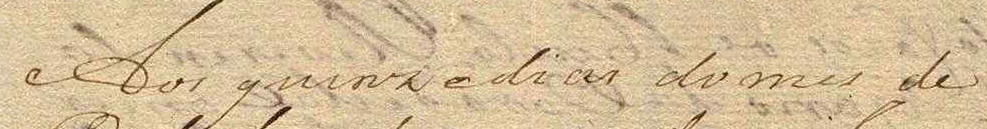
Aos quinze dias do mes de
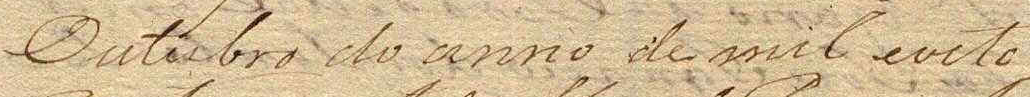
Outubro do anno de mil e oito
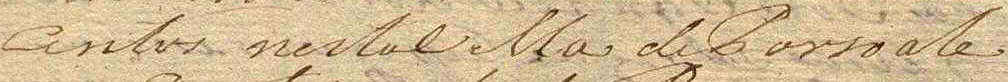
Centos nesta Villa de Porto ale
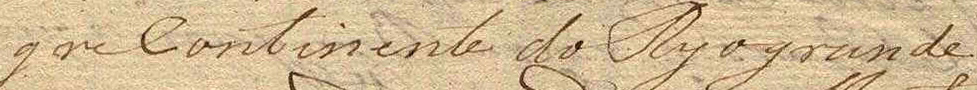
gre Continente do Ryo grande
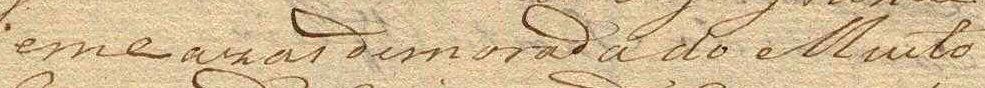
em cazas de morada do Muito
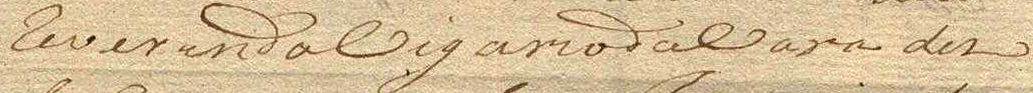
Reverendo Vigario da Vara des
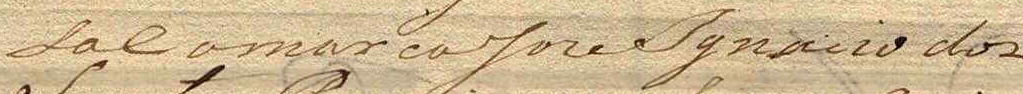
ta comarca Joze Ignacio dos
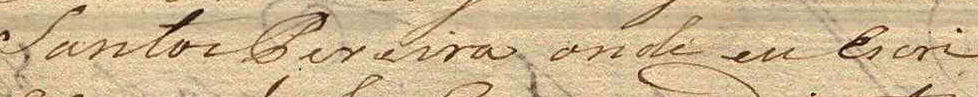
Santos Pereira, onde eu Escri
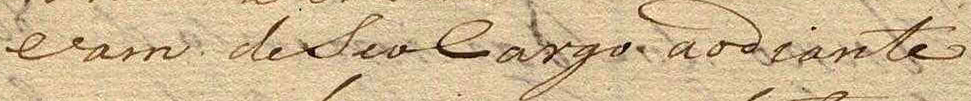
vam de Seo Cargo aodiante
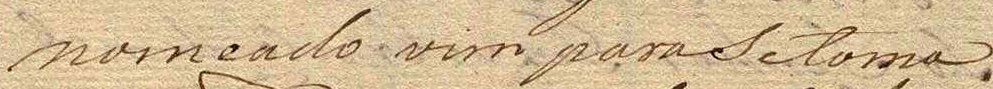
nomeado vim para Se toma
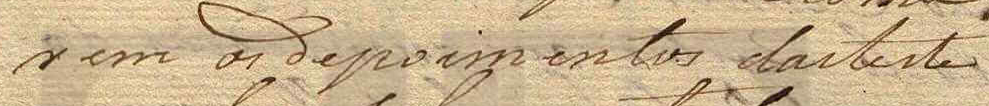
rem os depoimentos das teste
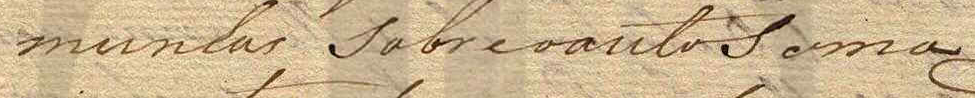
munhas sobre o auto Suma
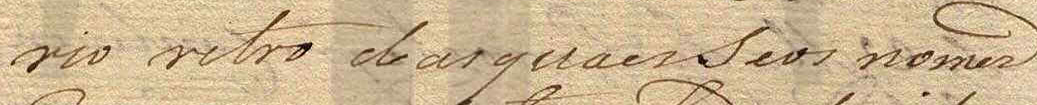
rio retro das quaes Seos nomes
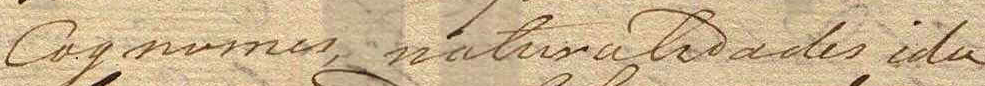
Cognomes, naturalidades ida
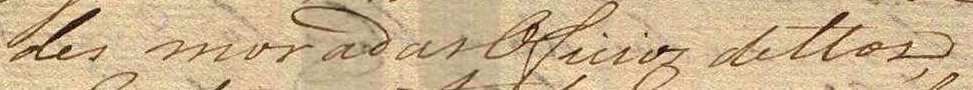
des moradas Oficios dittos,
